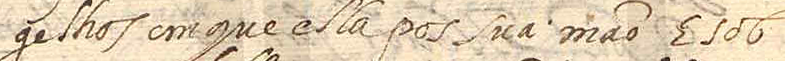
gelhos em que ella pos sua mão E sob
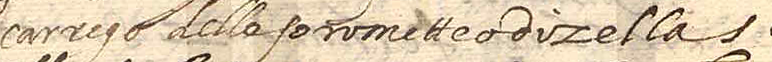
carrego delle prometteo dizellas.
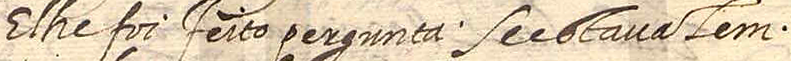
E lhe foi feito pergunta. se estava Lem.
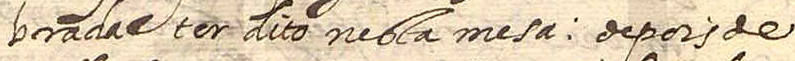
brada ter dito nesta mesa: depois de
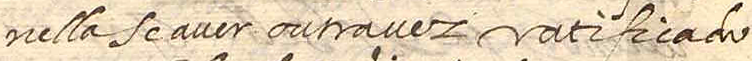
nella se auer outra vez ratificado
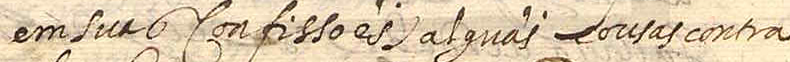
em suas Confissoẽs, alguās cousas contra
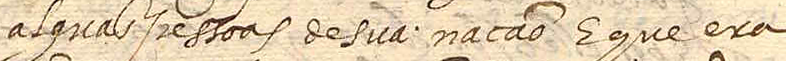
alguas̄ pessoas de sua. nacão E que era
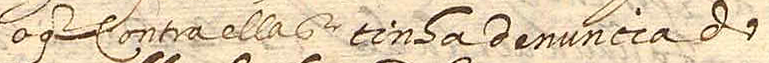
o q̄ Contra ellas tinha denunciado
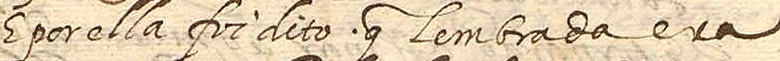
E por ella foi dito. q̄ lembrada era
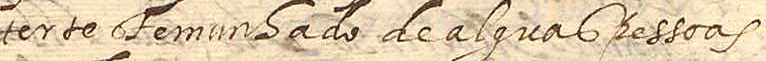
ter testemunhado de alguas̄ pessoas
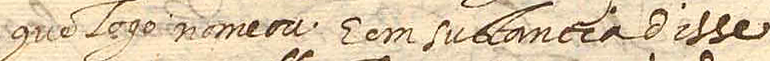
que Logo nomeou. E em sustancia disse
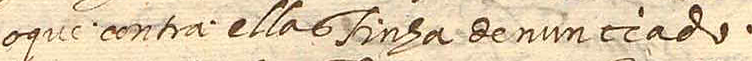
o que. contra. ellas tinha denunciado
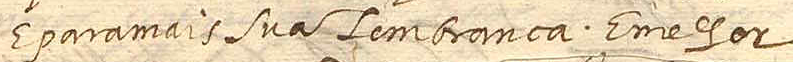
E para mais sua lembranca. E melhor
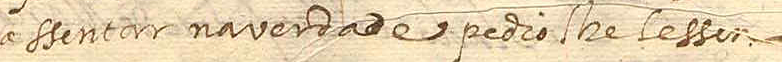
assentar na verdade pedio lhe lessen
